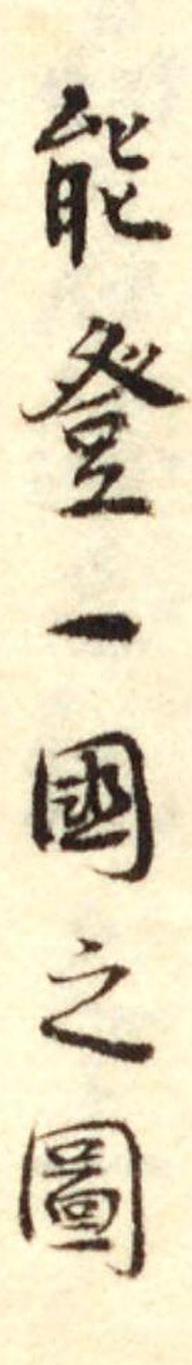能登一国之図
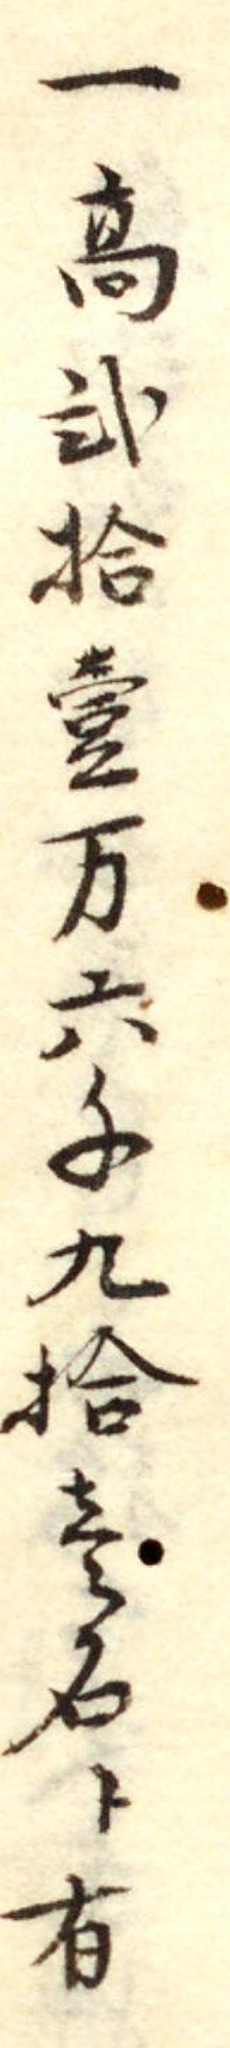一高弐拾壹万六千九拾壱石有
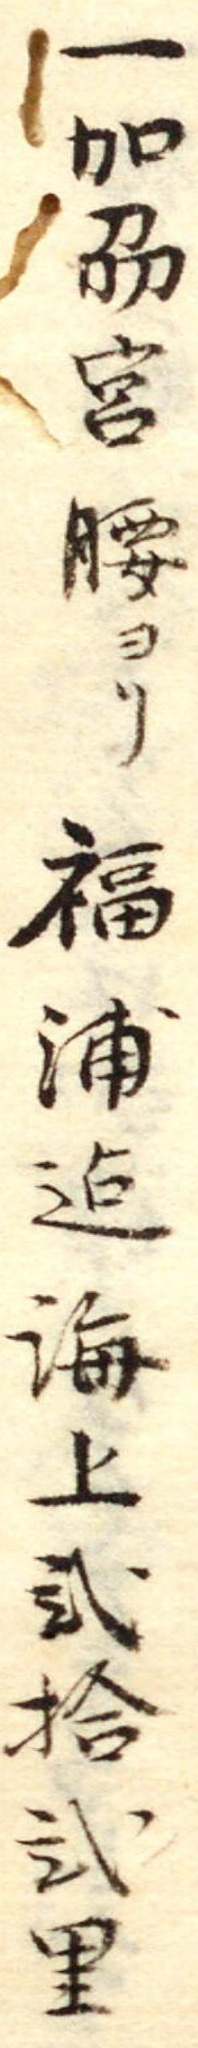一加州宮腰福浦迄海上弐拾弐里
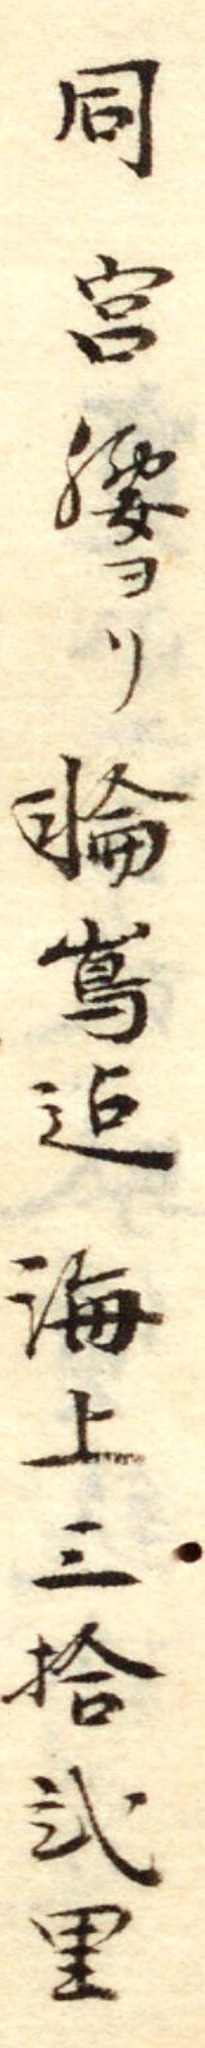同宮腰輪嶌迄海上三拾弐里
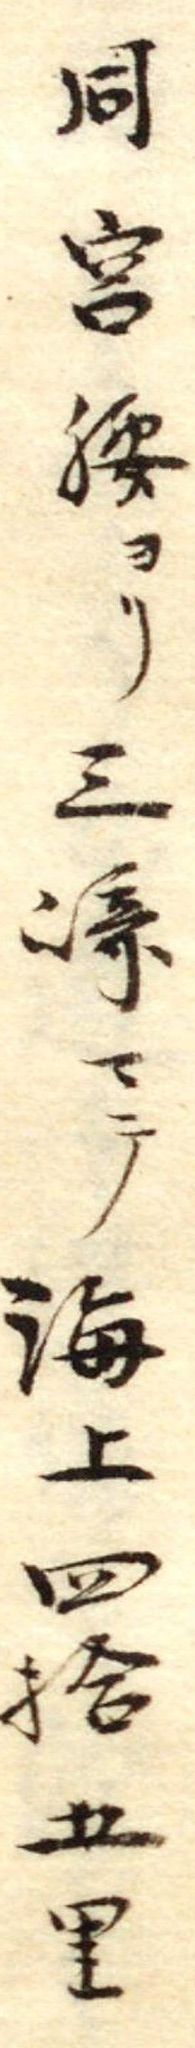同宮腰三崎海上四拾五里
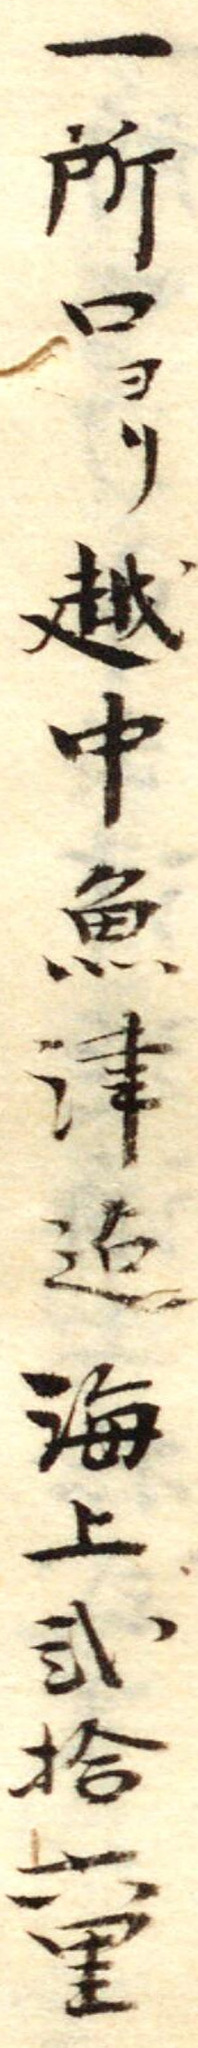一所口越中魚津迄海上弐拾六里

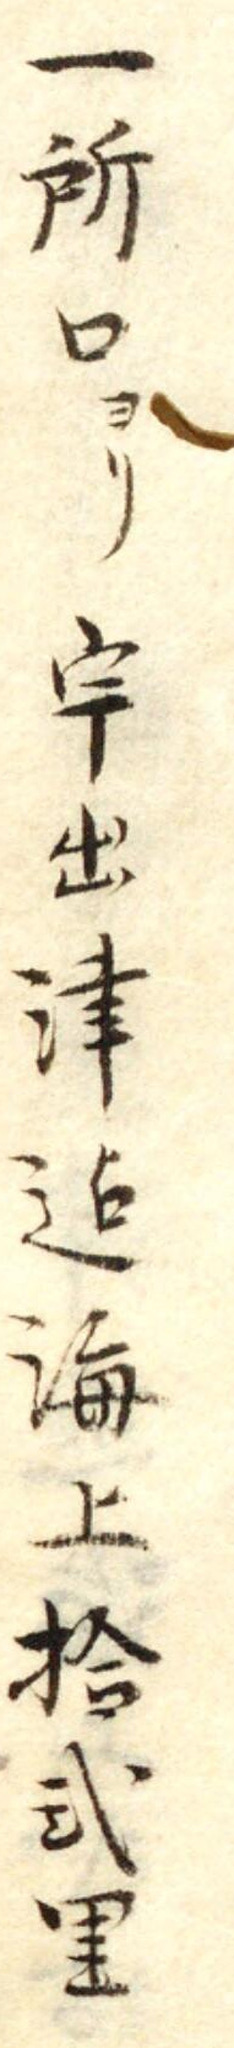一所口宇出津迄海上拾弐里
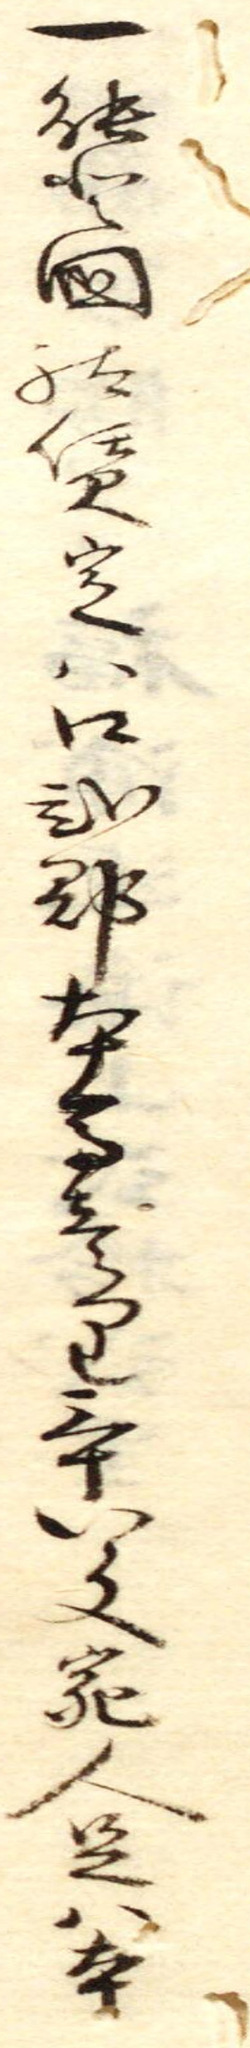一能登国駄賃定は口弐郡本馬壱里三十八文宛人足は本
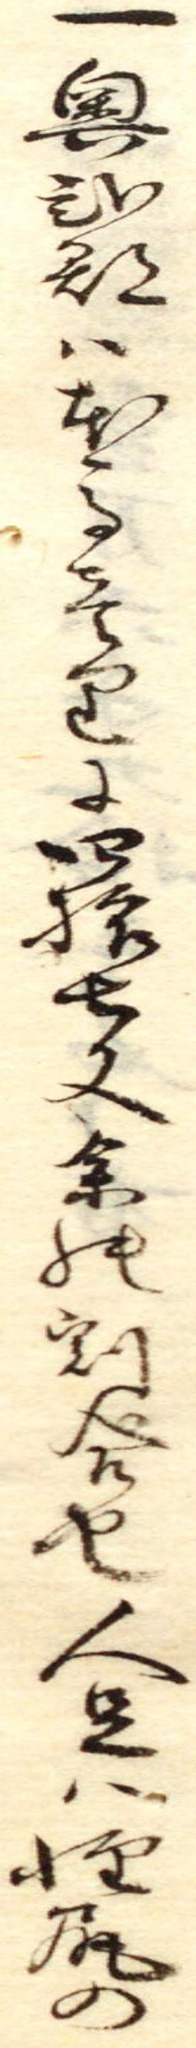一奥弐郡は本馬壱里に四拾七文余の割合也人足は軽尻の
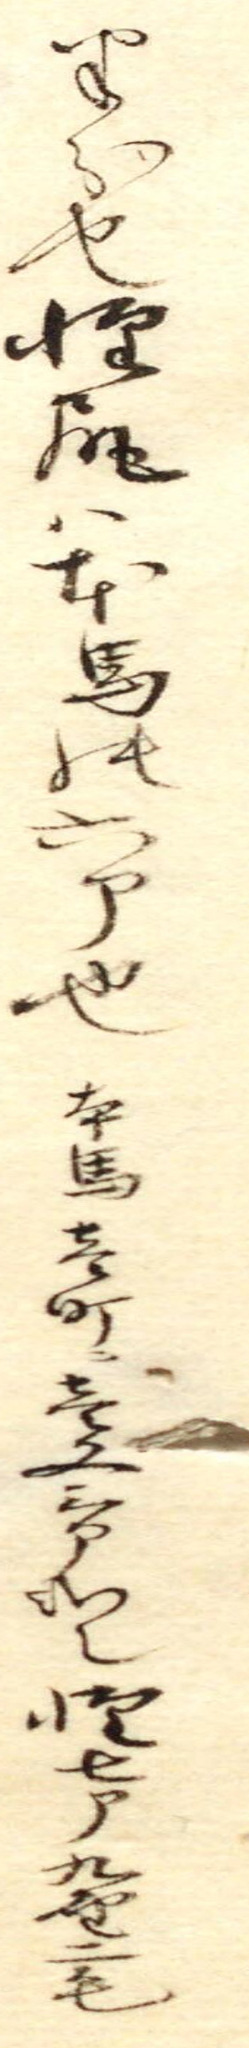半分也軽尻は本馬の六部也本馬壱町壱文三部弐也軽七部九厘に毛
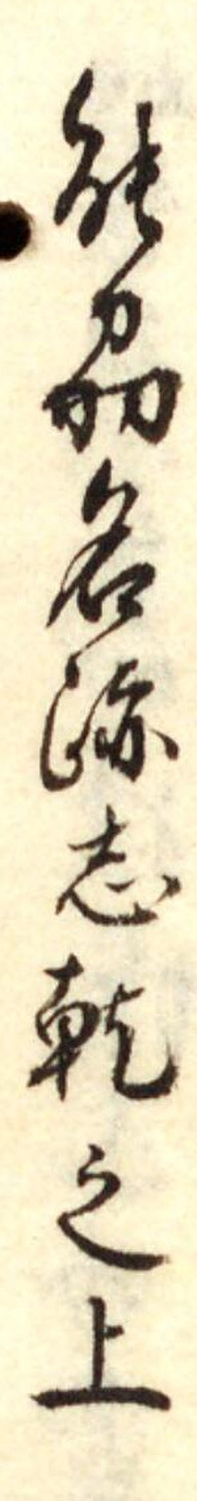能州名跡志乾之上
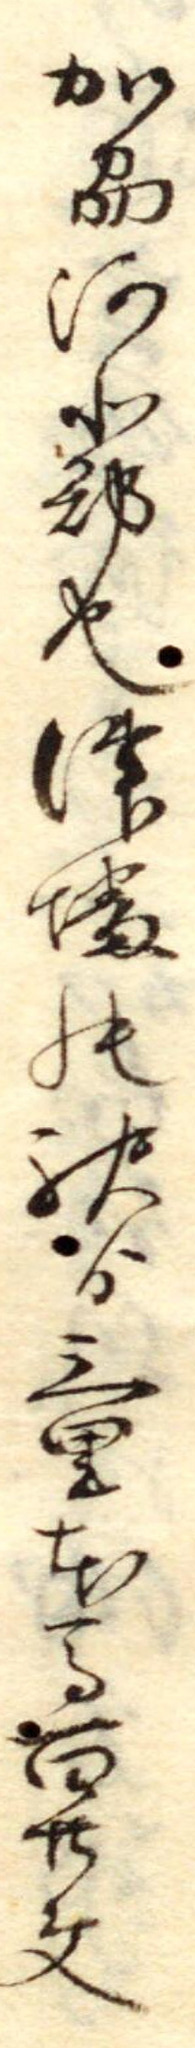加州河北郡也津幡の駅ゟ三里本馬百廿文
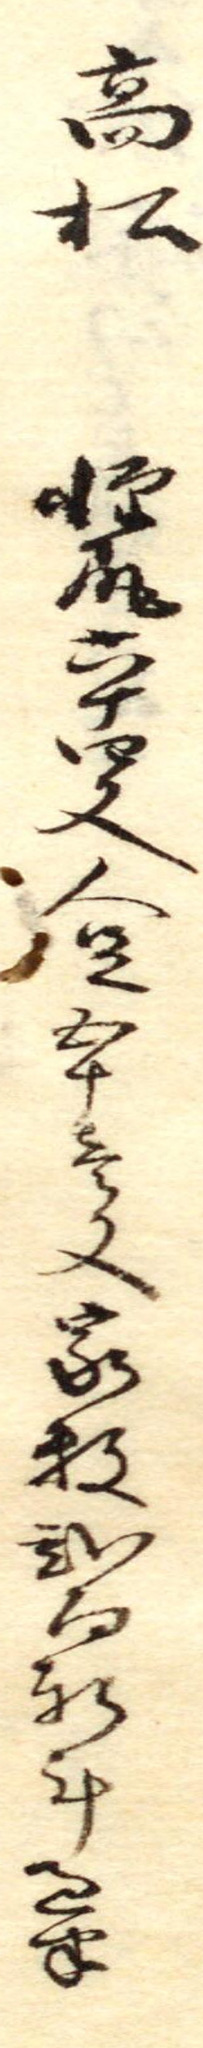高松軽尻六十四文人足五十壱文家数弐百軒斗過半
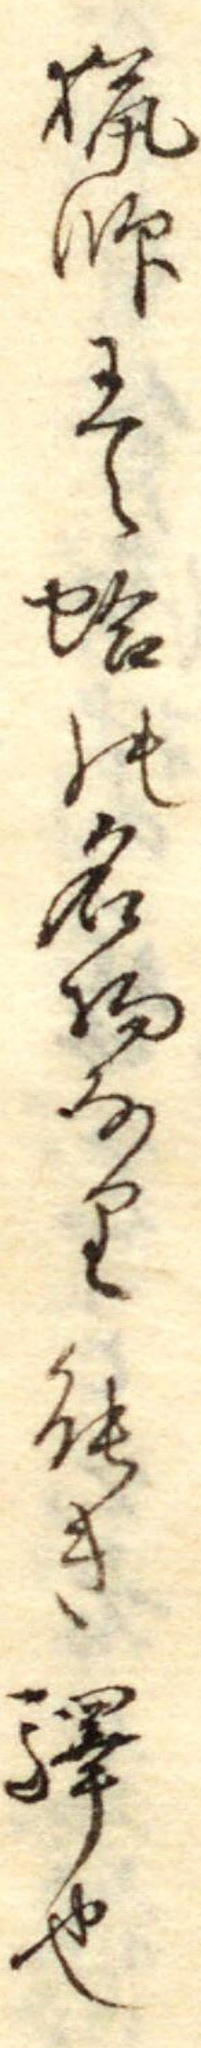猟師にて蛤の名物なり能き驛也
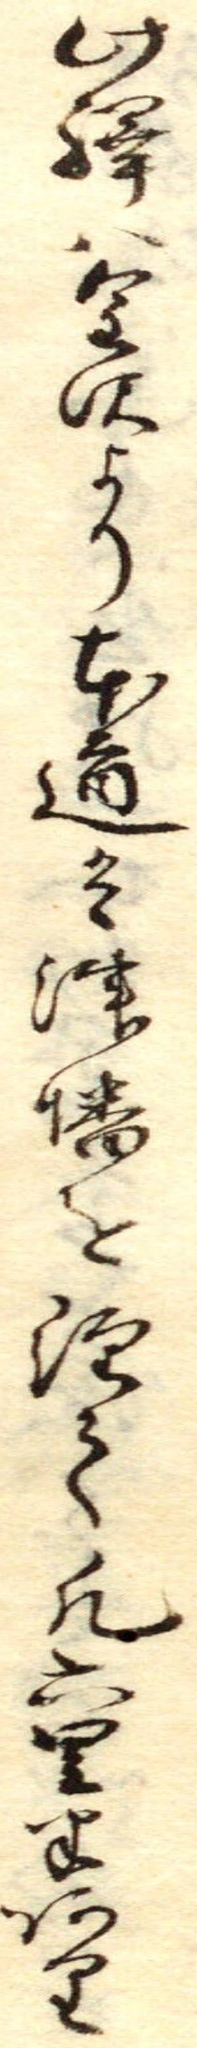此驛ハ金沢より本道は津幡を経て凢六里半あり
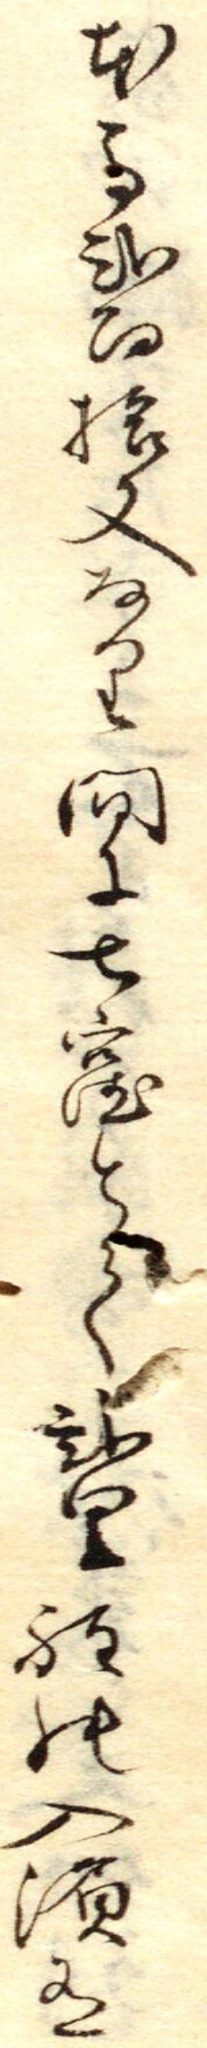本馬弐百拾文なり間に七窪とて弐里程の入濱有
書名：能登名跡誌
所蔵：Ishikawa Prefectural Library
